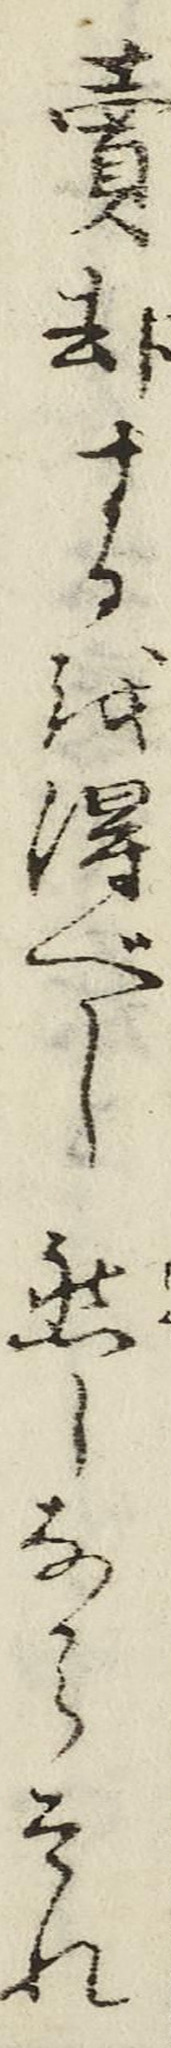売却するを得べし然しなからそれ
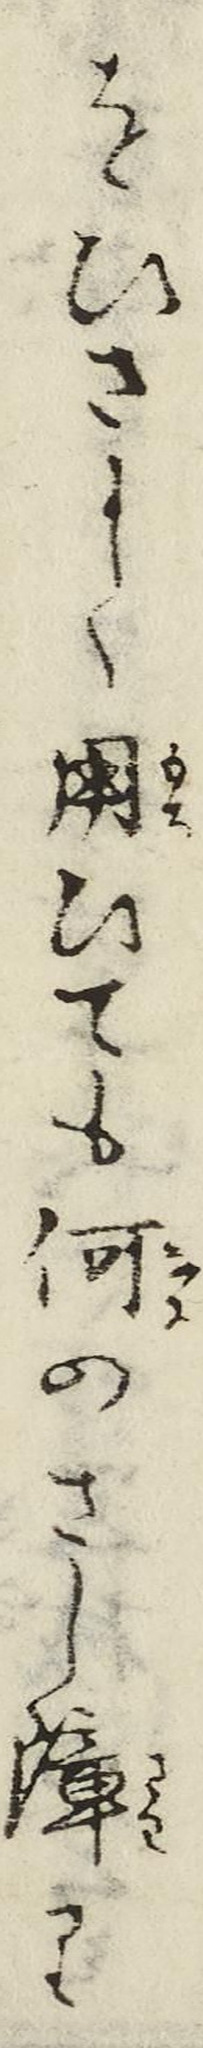をひさしく用ひても何のさし障り
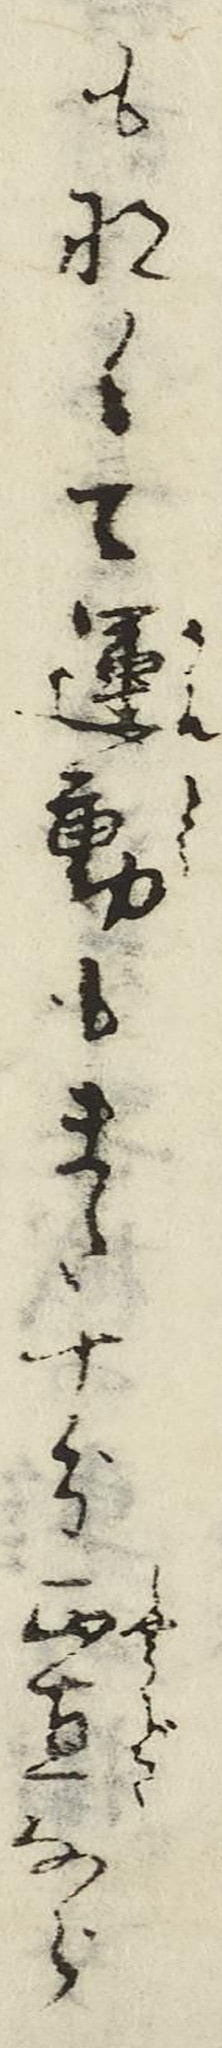もなくて運動もまた十分正直なら
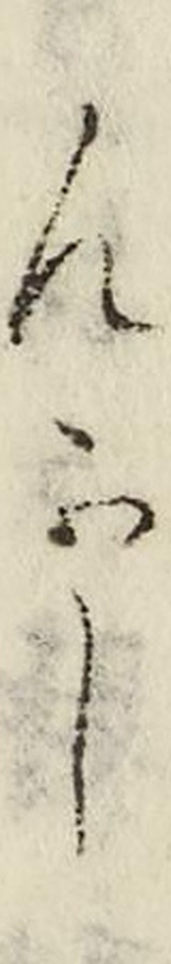んかし
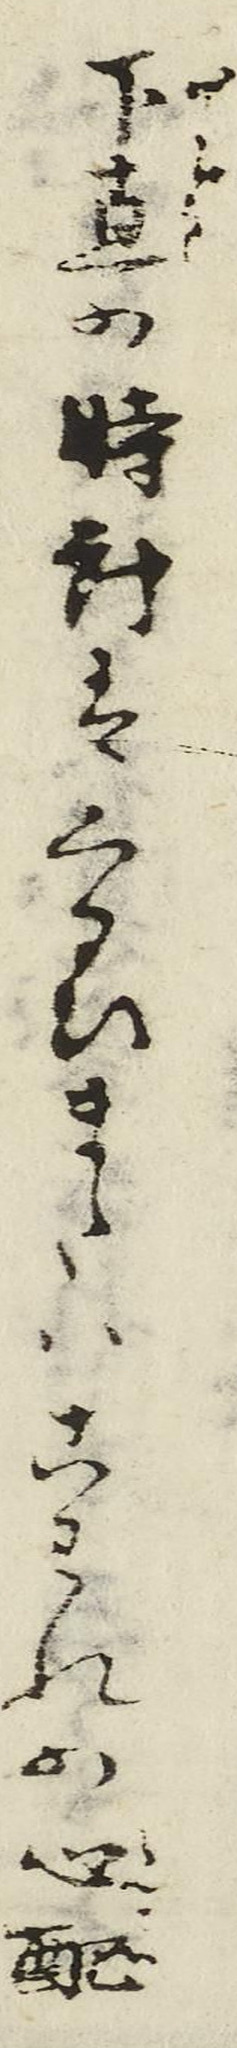下直の時計はくるひまたはこわれの心配
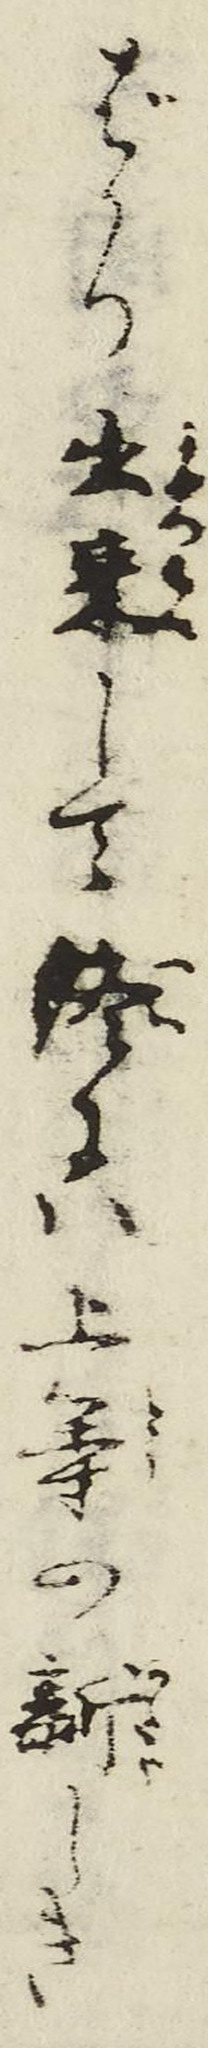ばかり出来して終には上等の新しき
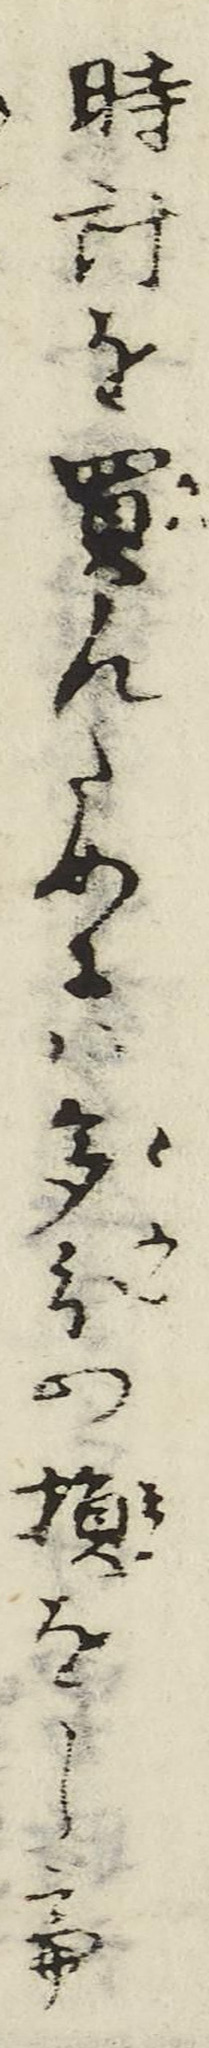時計を買んためには多分の損をして
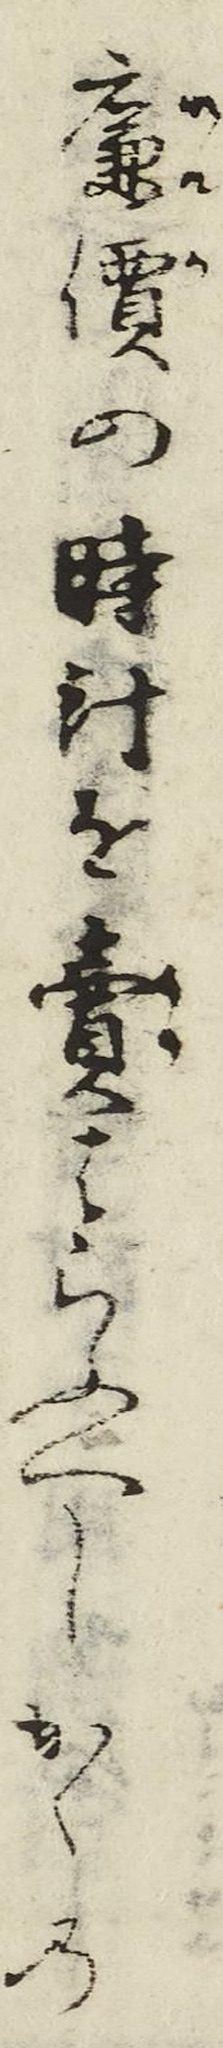廉価の時計を売はらふへしかくの
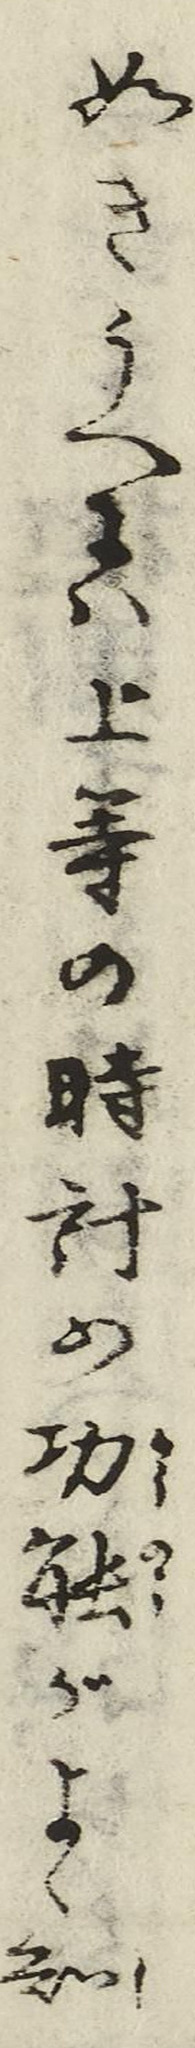如きうへには上等の時計の功能がよく知
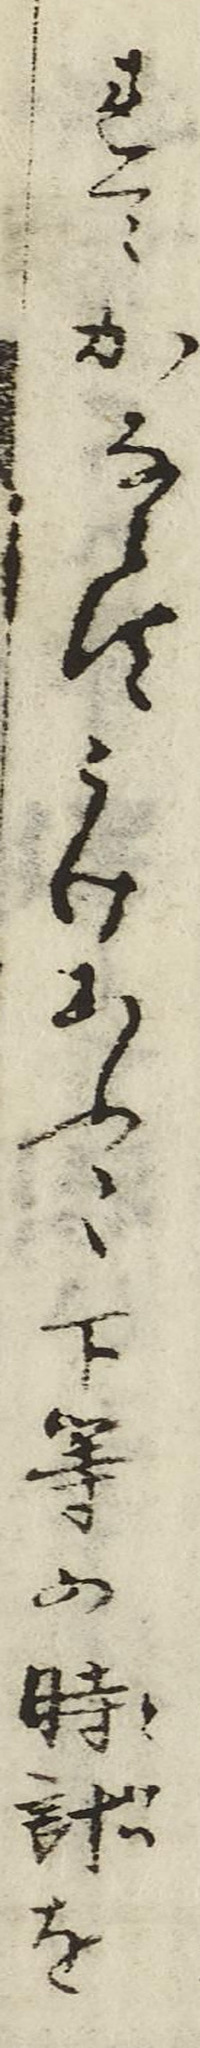れてかならすうけあふに下等の時計を

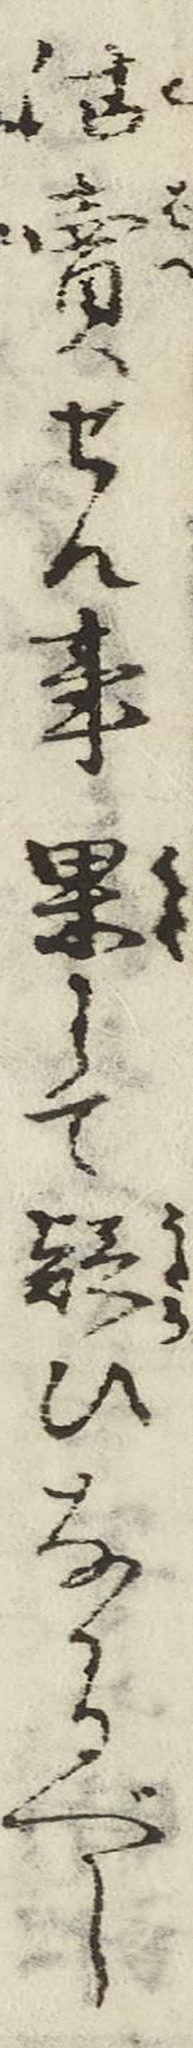估売せん事果して疑ひなるべし
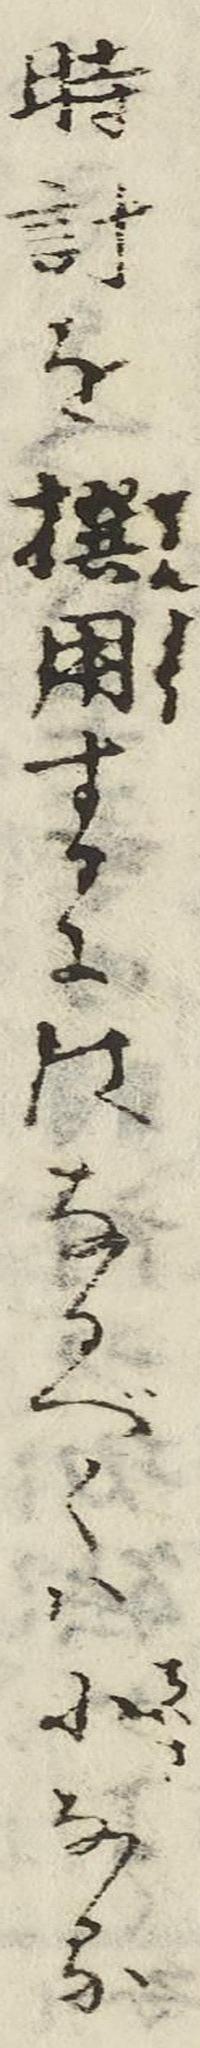時計を撰用するにはなるべくは小なる
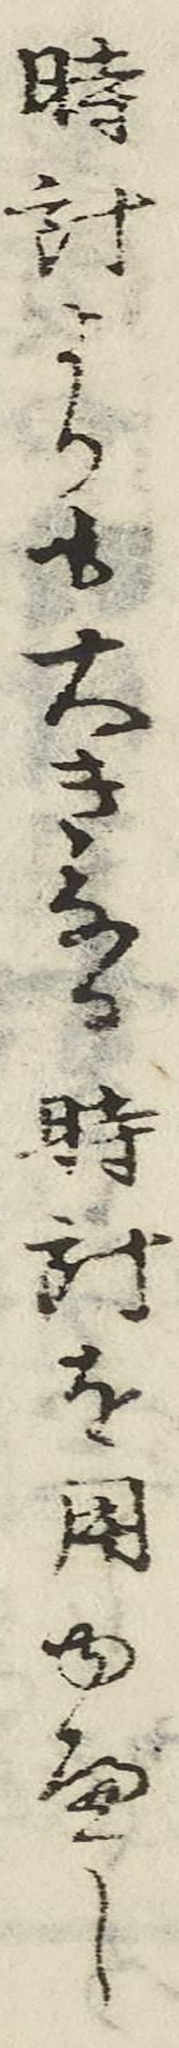時計よりも大きなる時計を用ゆべし
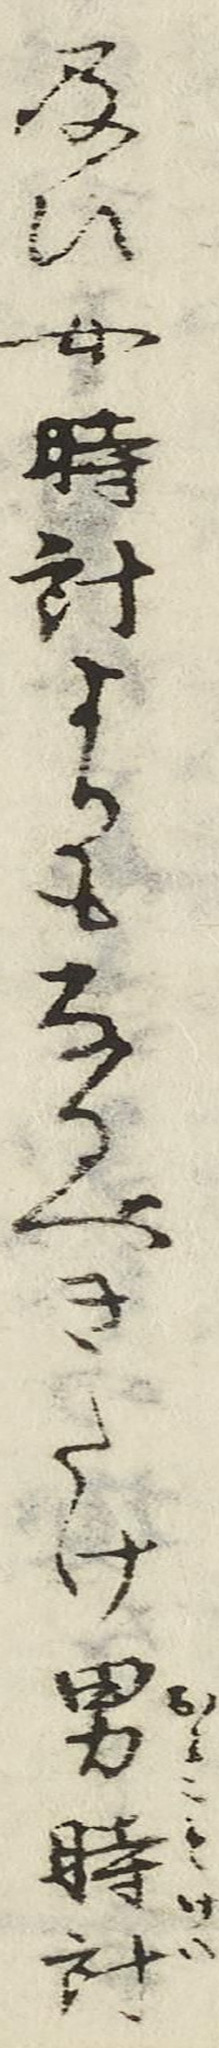及ひ女時計よりもなるべきたけ男時計
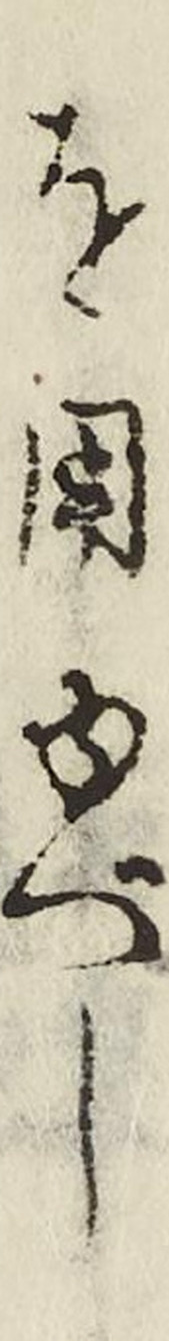を用ゆべし
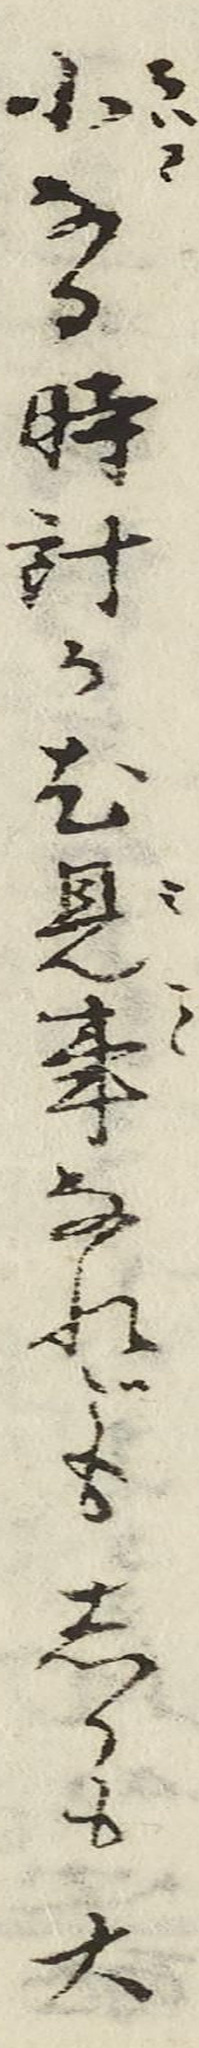小なる時計か尤見事なれどもしかも大
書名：[時計に関する冊子]
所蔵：東京大学地震研究所図書室 Earthquake Research Institute Library, The University of Tokyo, JAPAN
